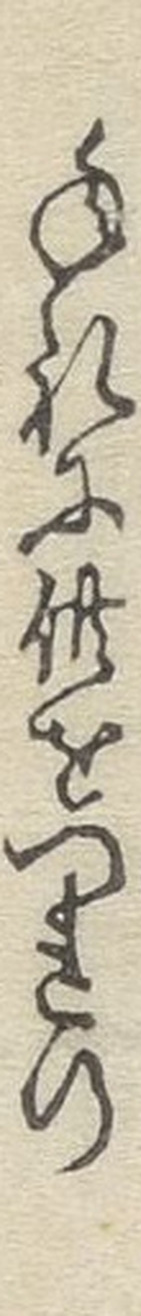年礼に供をつれ行
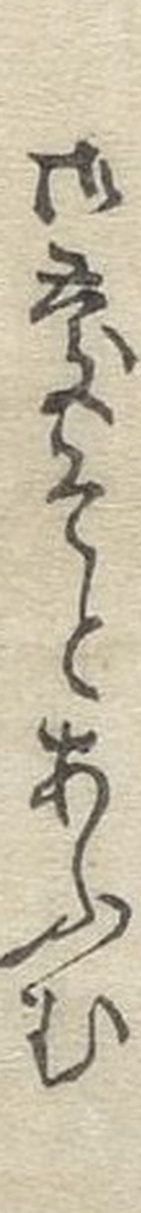御慶そとあふむ
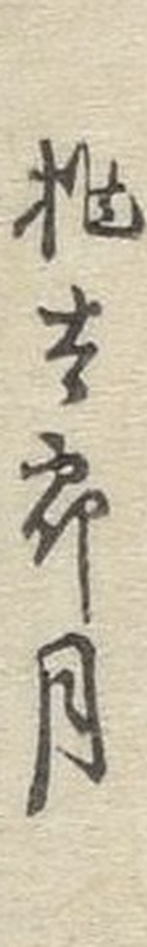桃太郎月
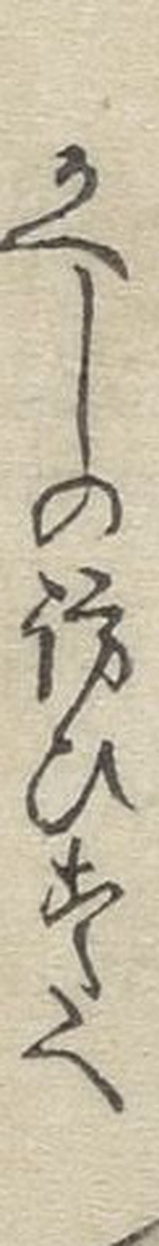かへしの訪ひこたへ
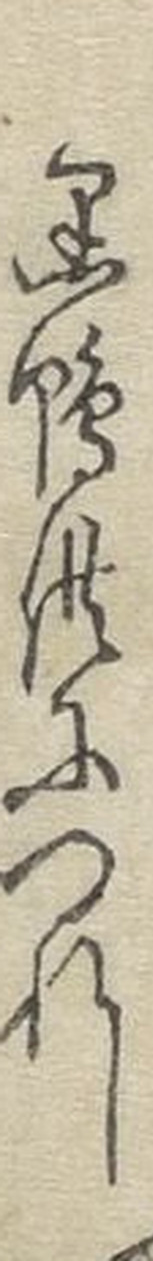黒鴨供につれし
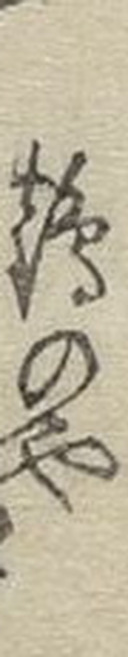鶴のや

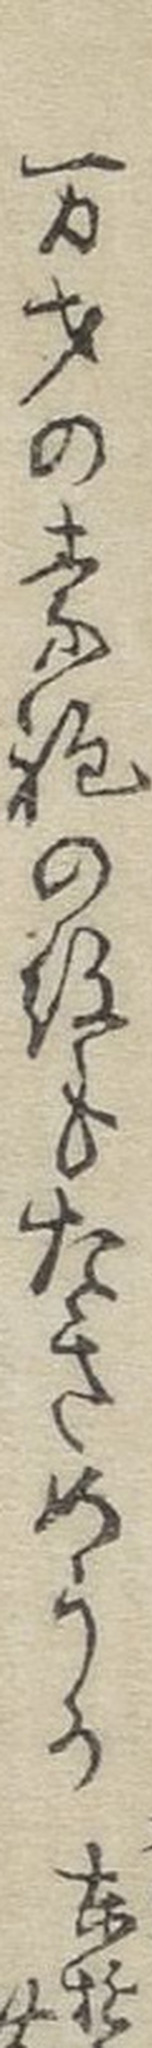万才の素袍の紋もたきめうか東遊亭
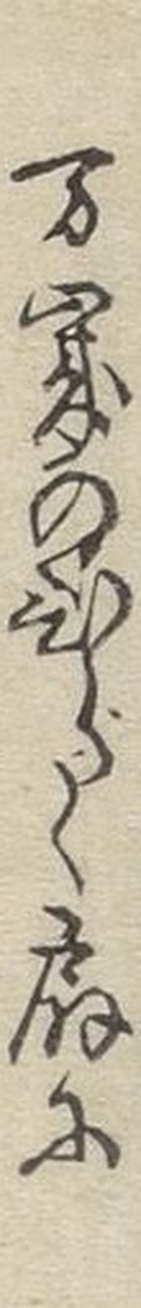万歳のひらく扇に
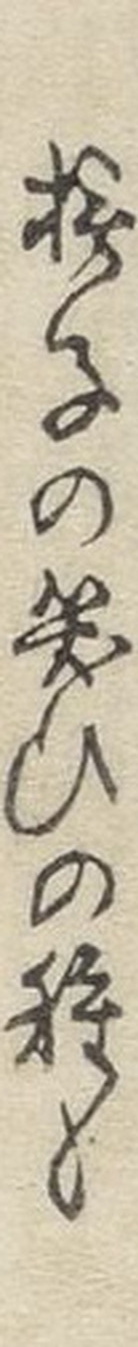撫子の笑ひの種も
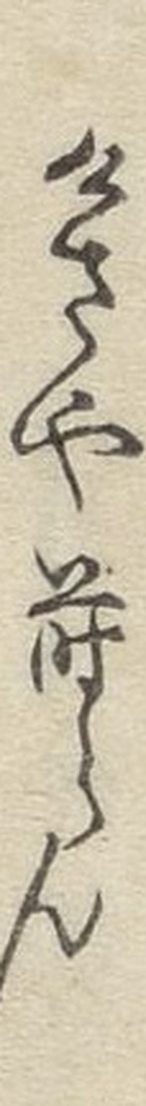けさや蒔くらん
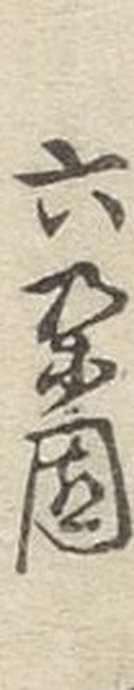六朶園
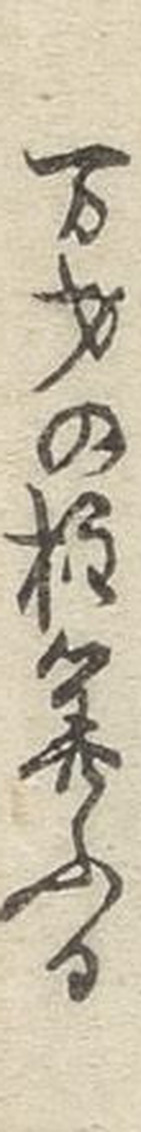万才の柱算ふる
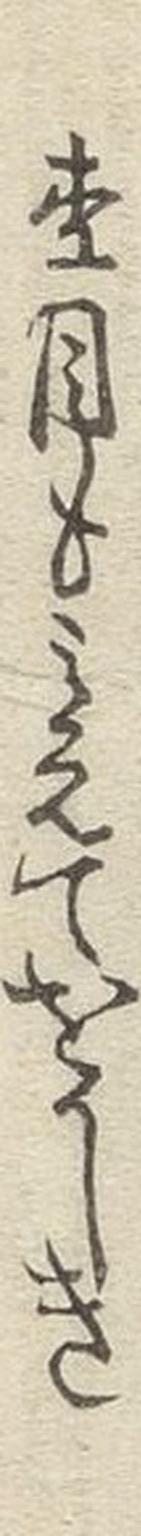杢目もみえてをかしき
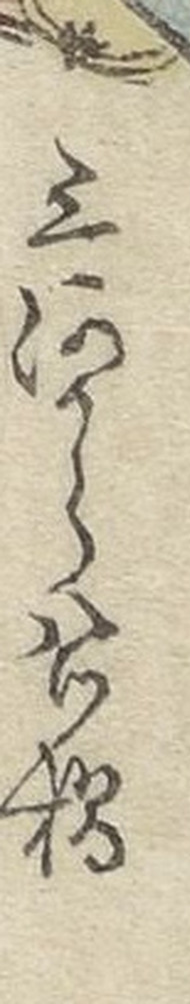三河から八ツ橋
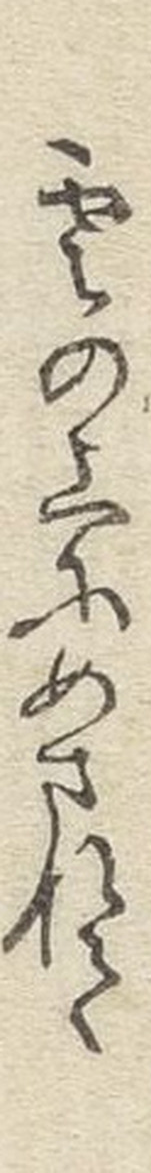雲の上にめされて
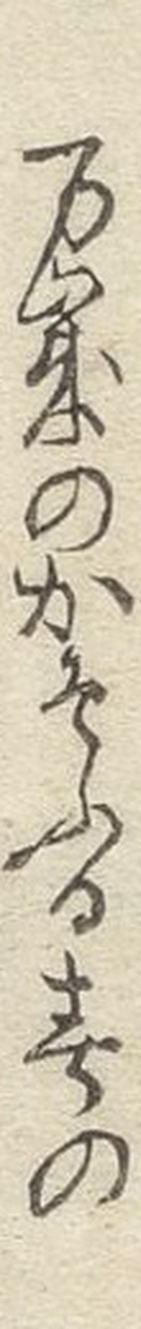万歳のかそふる春の
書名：Picture Album of People with Kyōka (Light Verse) (Kyōka shiki jinbutsu 狂歌四季人物)
